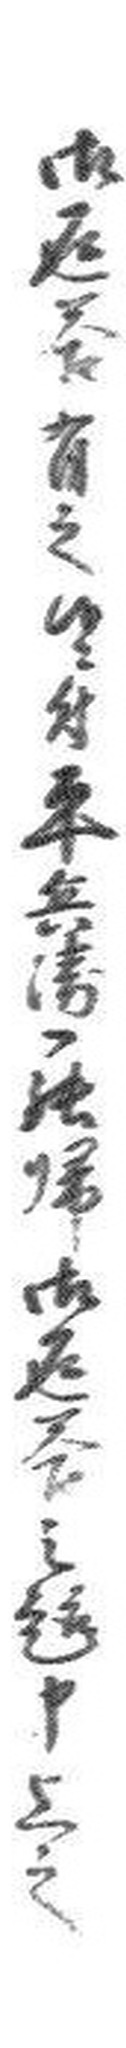御返答有之候ニ付平兵衛罷帰御返答之趣申上之
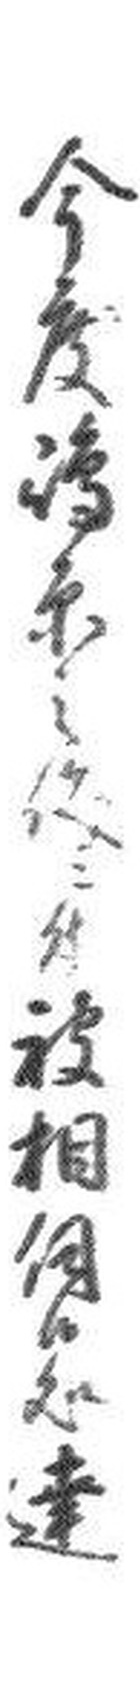今度島原之儀ニ付被相伺候処達
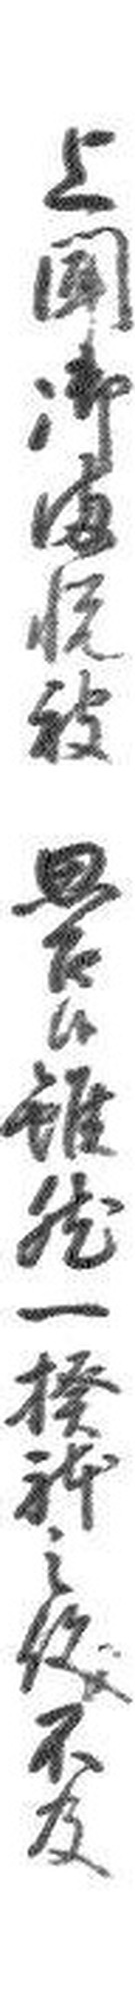上聞御満悦被思召候雖然一揆体之儀不及
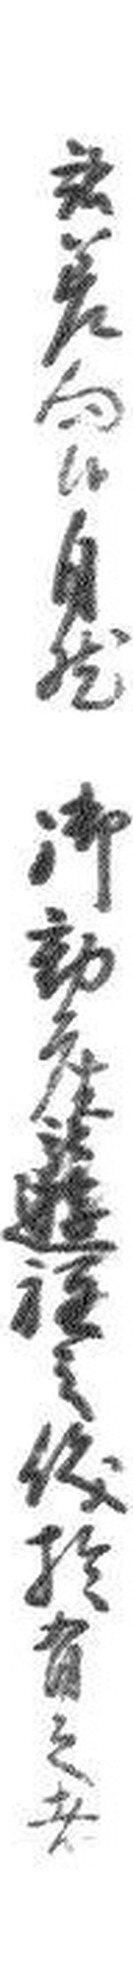被差向候自然御動座被遊程之儀於有之者
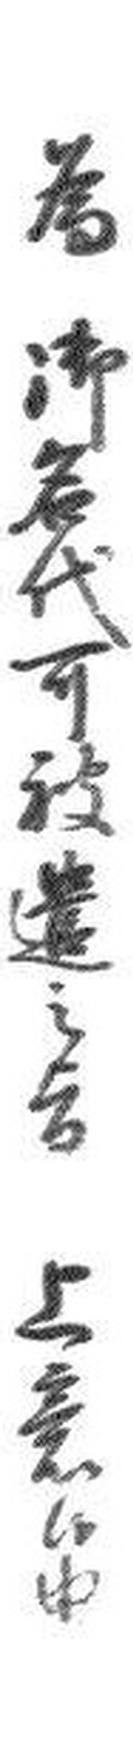為御名代可被遣之旨上意候由

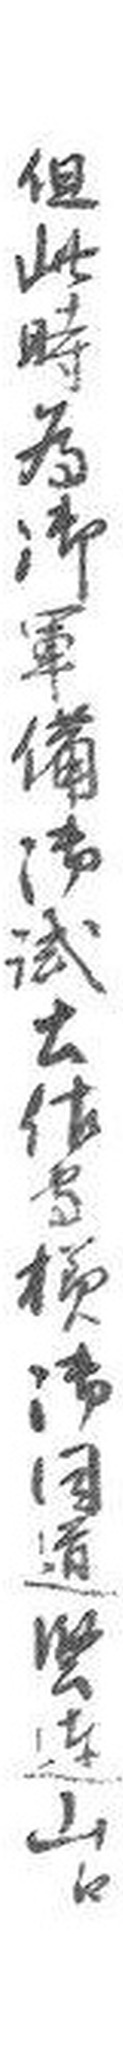但此時為御軍備御試土佐守様御同道堅達山江
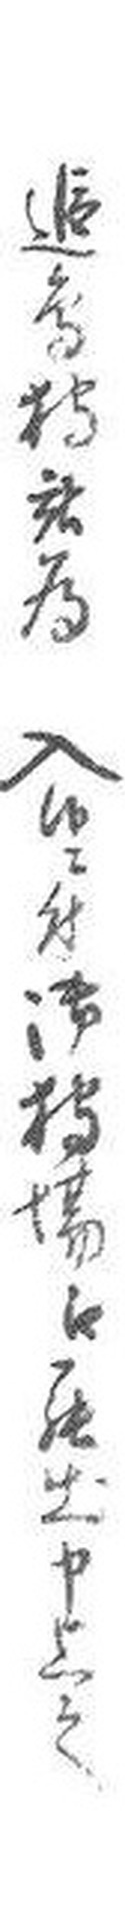追鳥狩被為入候ニ付御狩場江罷出申上之
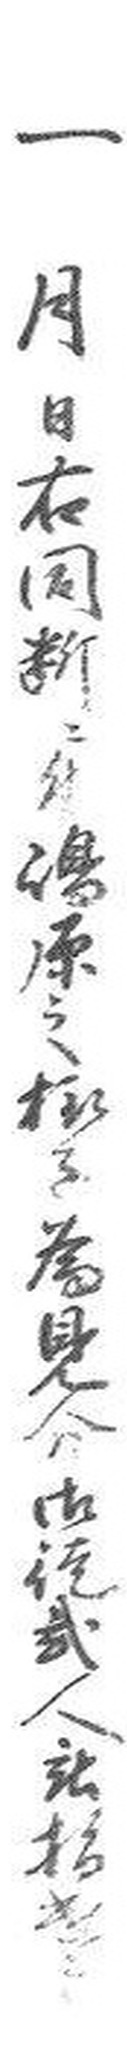一月日右同断ニ付島原之様子為見分御徒弐人被指遣之
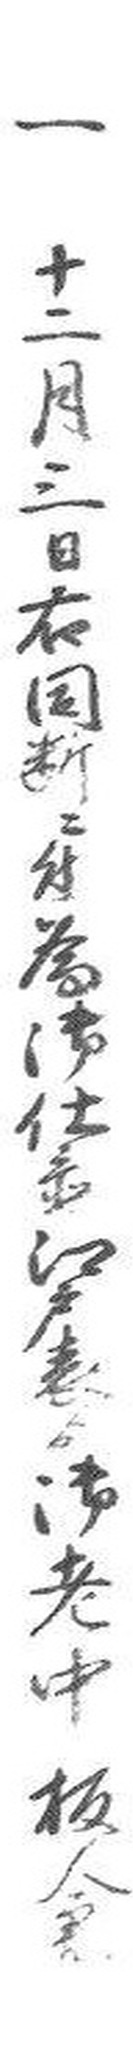一十二月三日右同断ニ付為御仕置江戸表ゟ御老中板倉
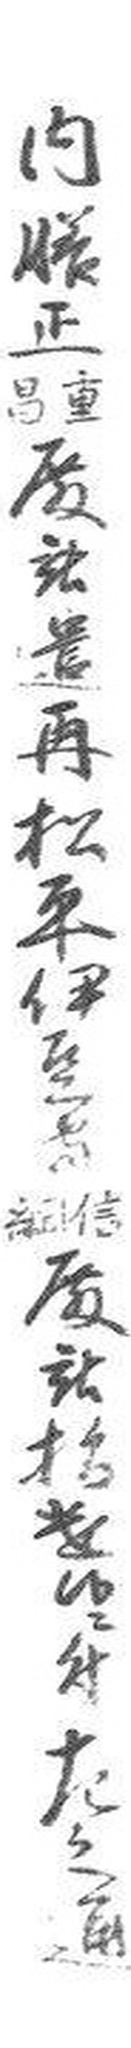内膳正重昌殿被遣再松平伊豆守信綱殿被指遣候ニ付左之通
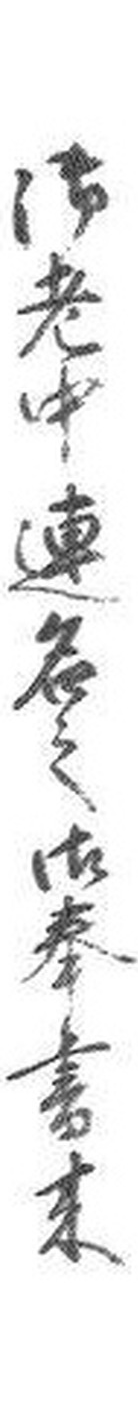御老中連名之御奉書来
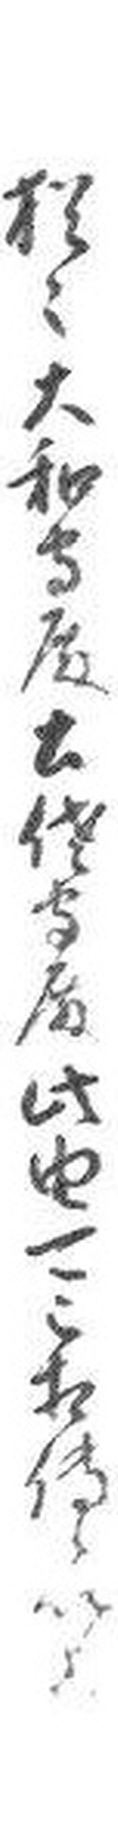猶々大和守殿土佐守殿此由可被相伝候以上
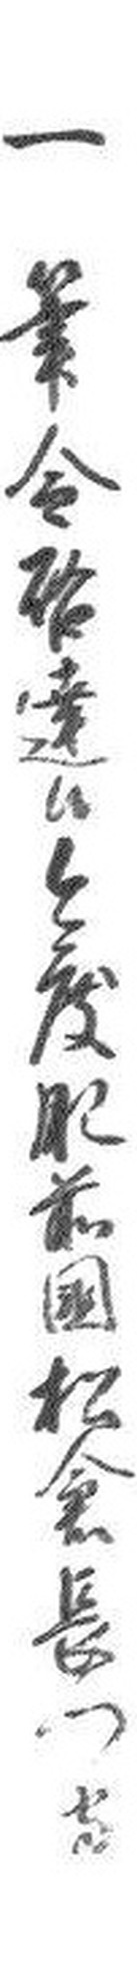一筆令啓達候今度肥前国松倉長門守
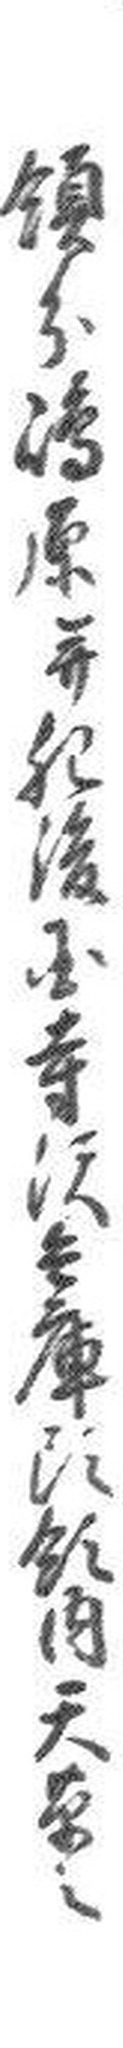領分島原并肥後国寺沢兵庫頭領内天草之
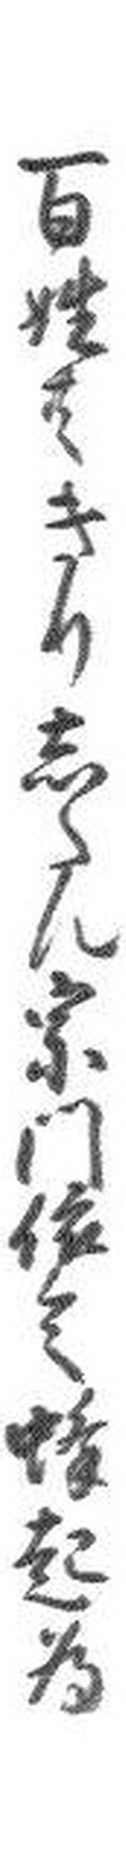百姓共きりしたん宗門依令蜂起為
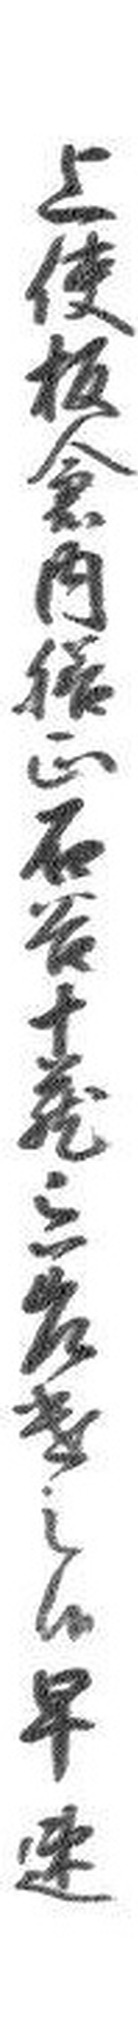上使板倉内膳正石谷十蔵被差遣之候早速
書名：家譜 四 忠昌公 従寛永七年到正保四年
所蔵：福井県文書館 Fukui Prefectural Archives
